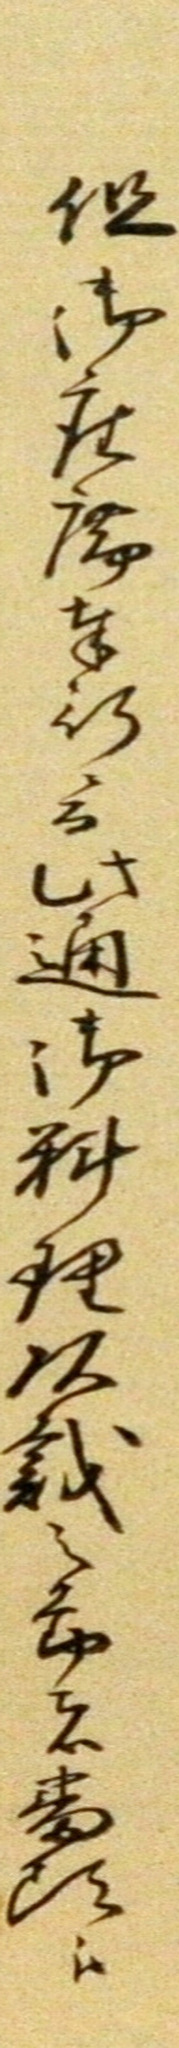但御座席奉行ニ而此通御料理頂戴之節は番頭え
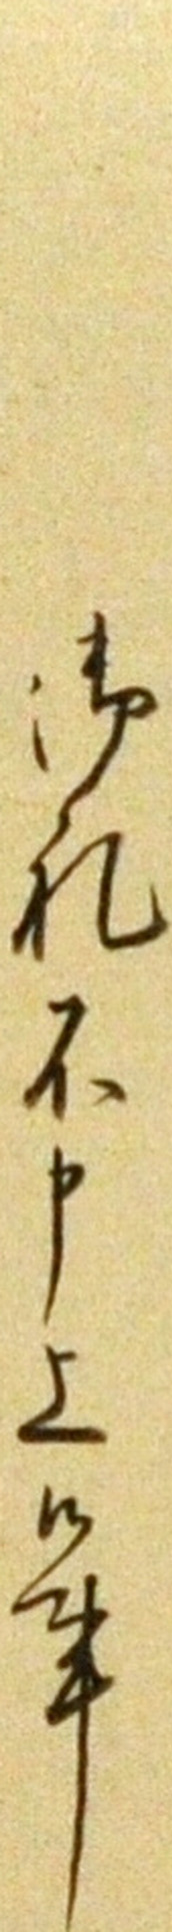御礼不申上候事
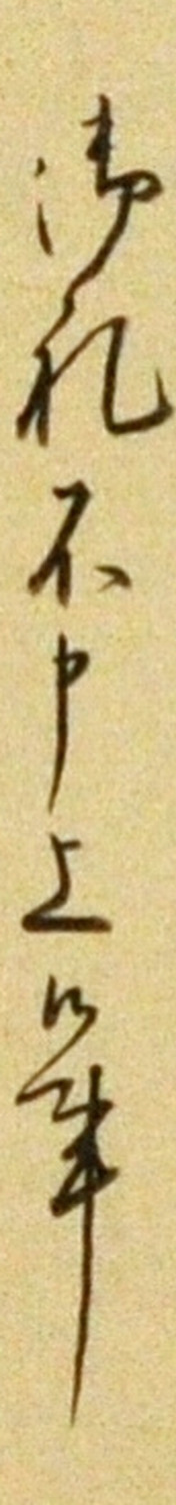御礼不申上候事
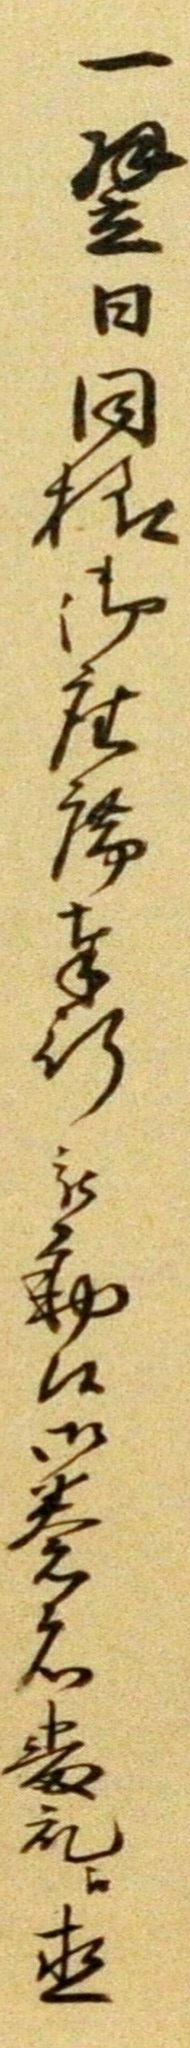一翌日同様御座席奉行被勤候御奏者番衆え直
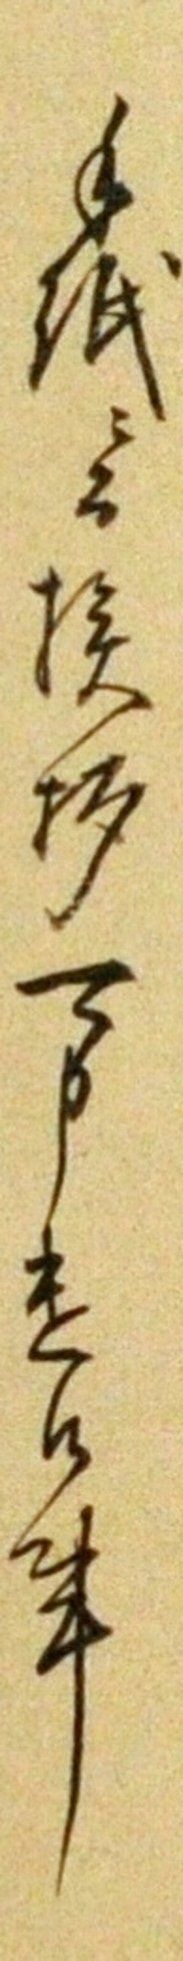手紙ニ而挨拶可申遣候事

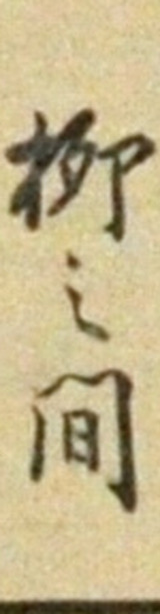栁之間
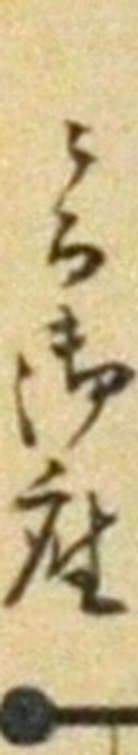ニ而御座
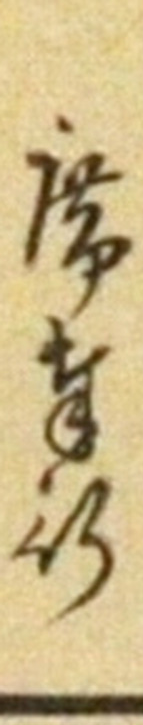席奉行
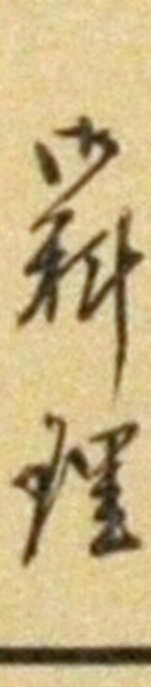御料理
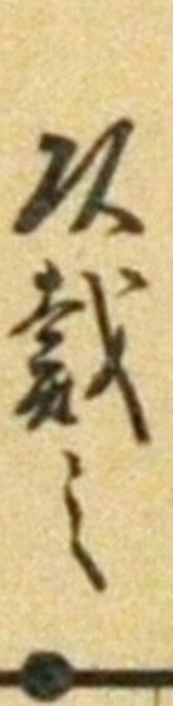頂戴之
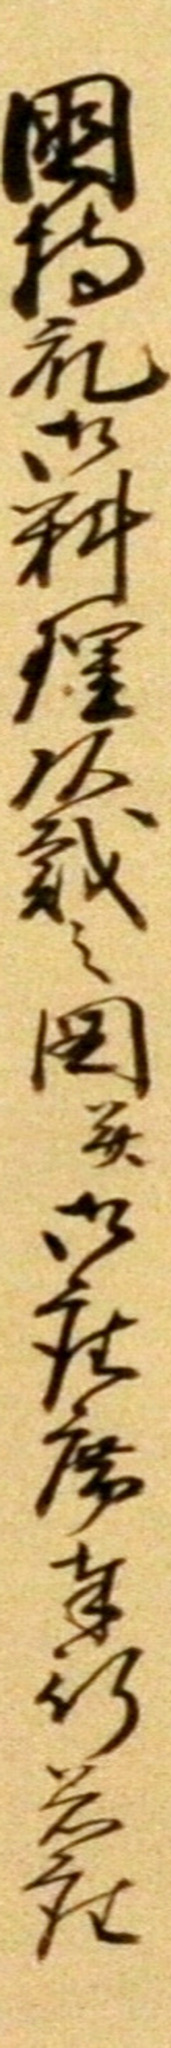國持衆御料理頂戴之図并御座席奉行着座
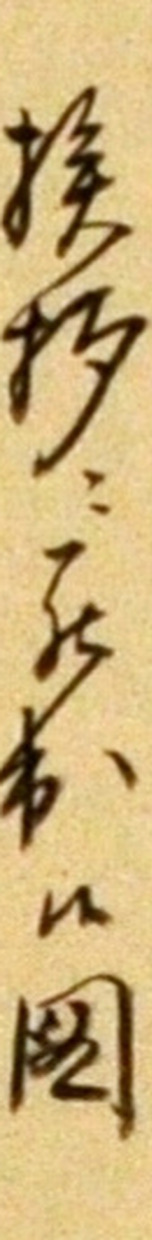挨拶ニ罷出候図
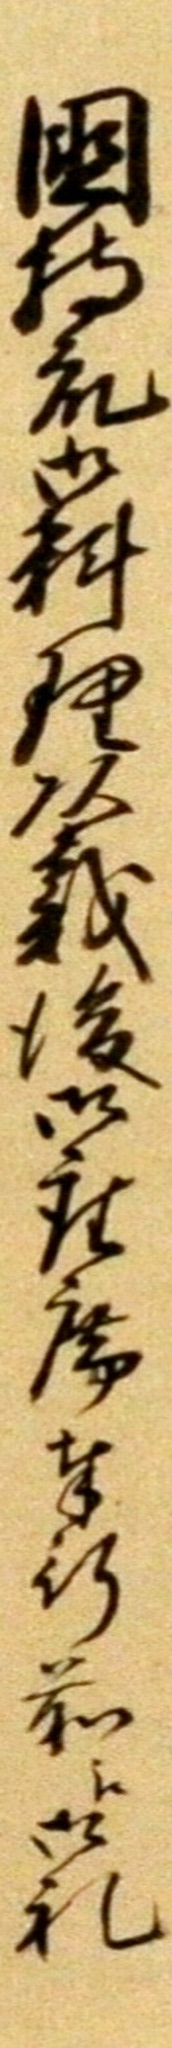國持衆御料理頂戴後御座席奉行前え御礼
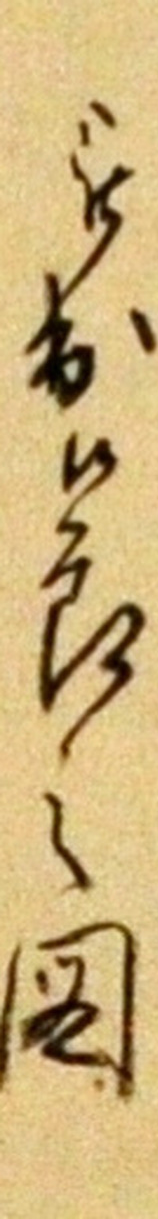罷出候節之図

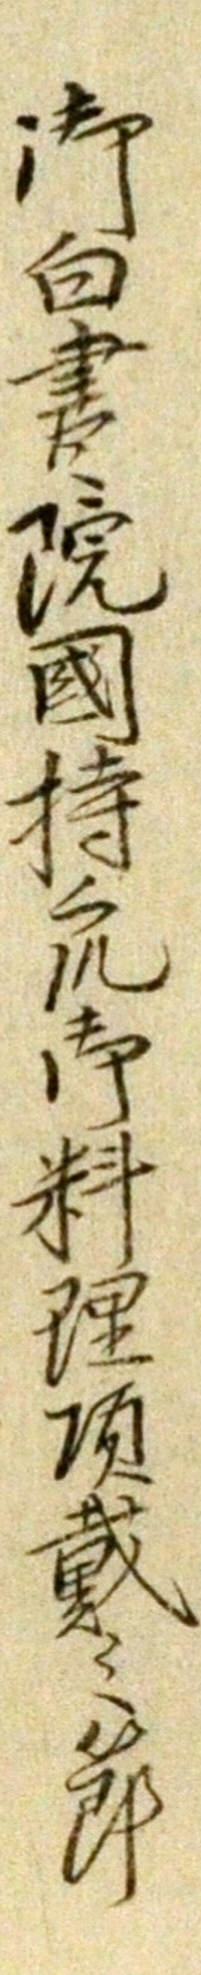御白書院國持衆御料理頂戴之節
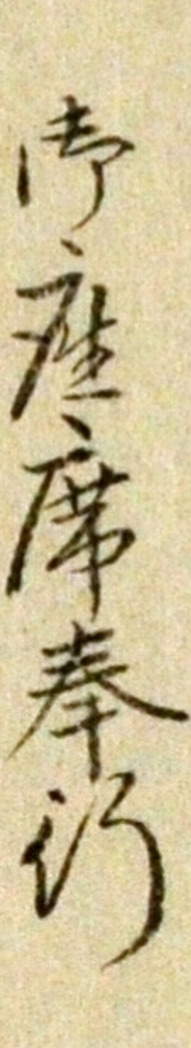御座席奉行
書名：御白書院御座席奉行勤方留外
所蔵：伊那市立高遠町図書館・合同会社AMANE
